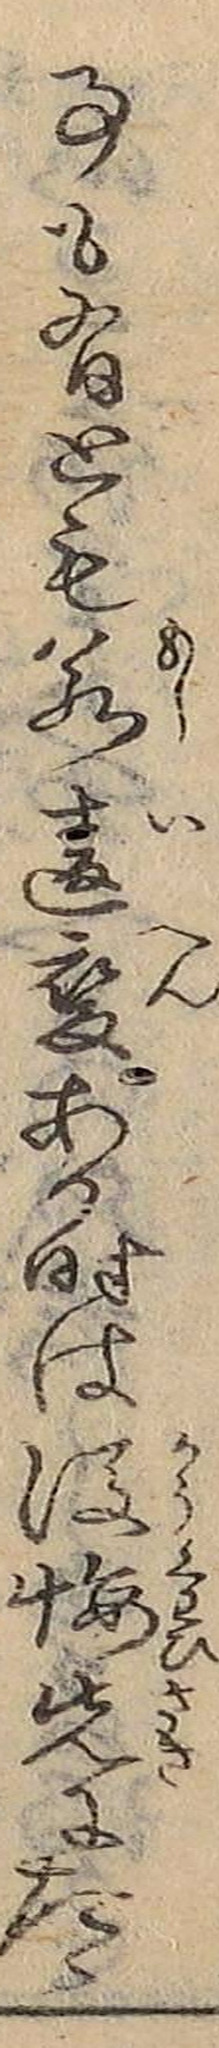事も有とも若違変ある時は後悔先にたゝ
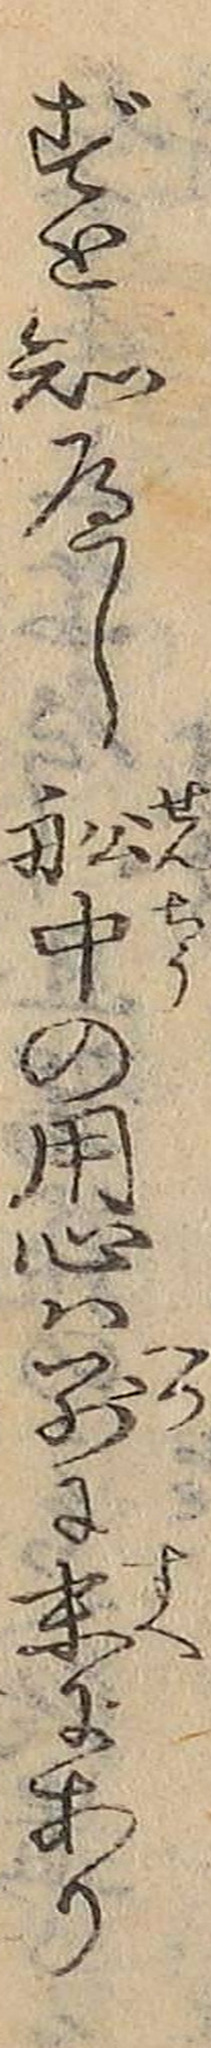ずと知へし船中の用心は別に末にあり
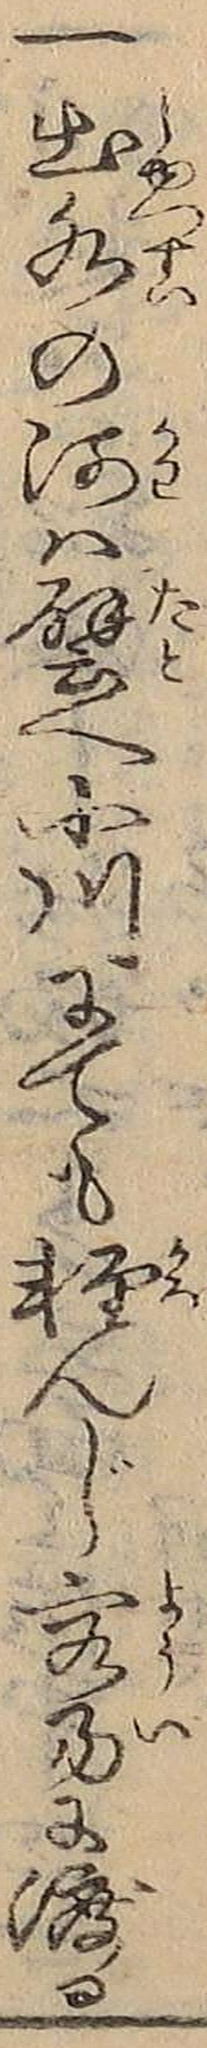一出水の河は譬へ小川にても軽じ容易に渡る
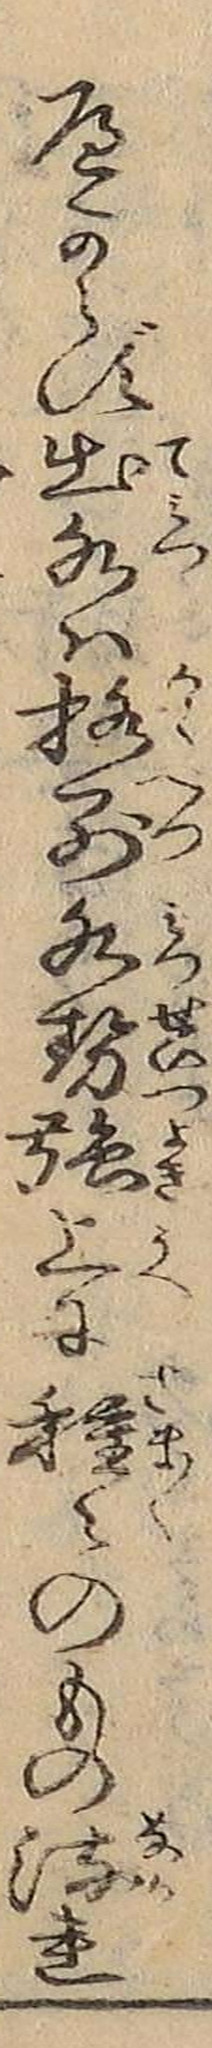へからず出水は格別水勢強上に種々のもの流れ
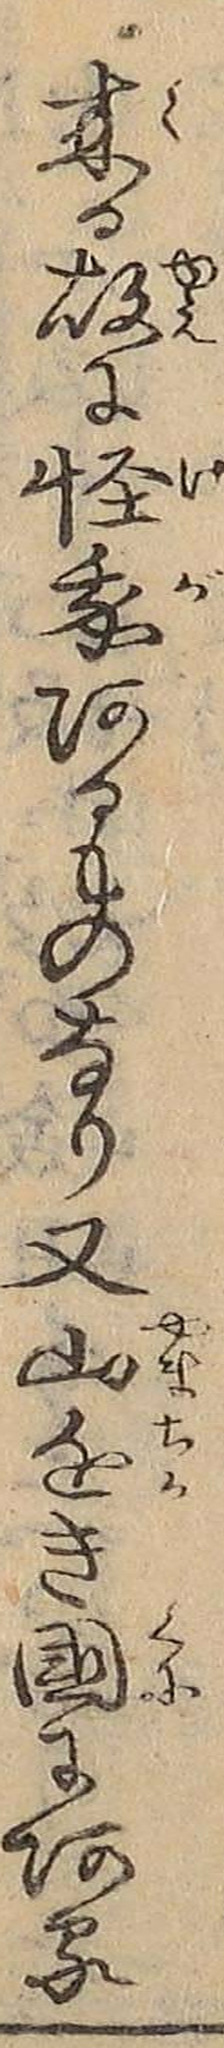来る故に怪我あるものなり又山近き国にある
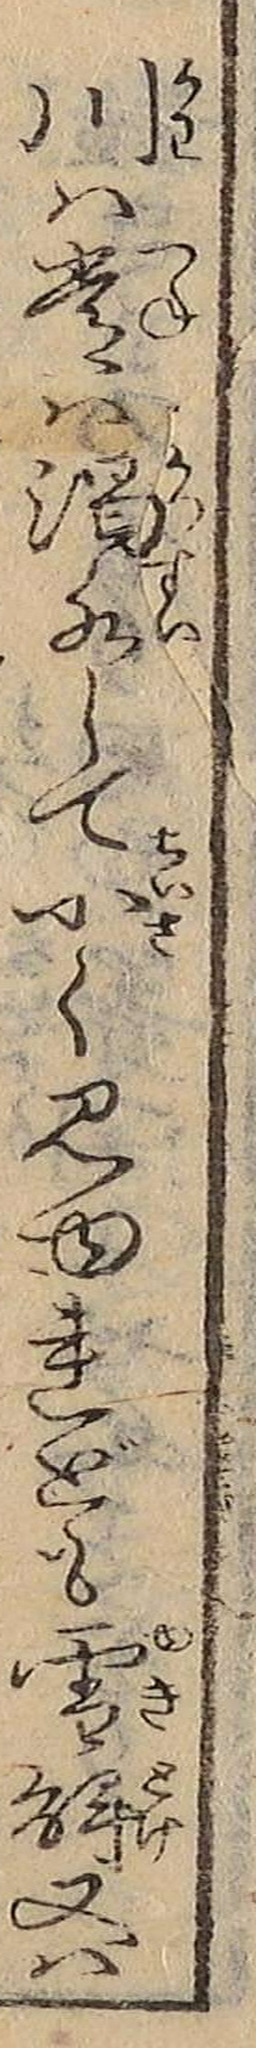川は常は渇水して小く見ゆれども雪解又は
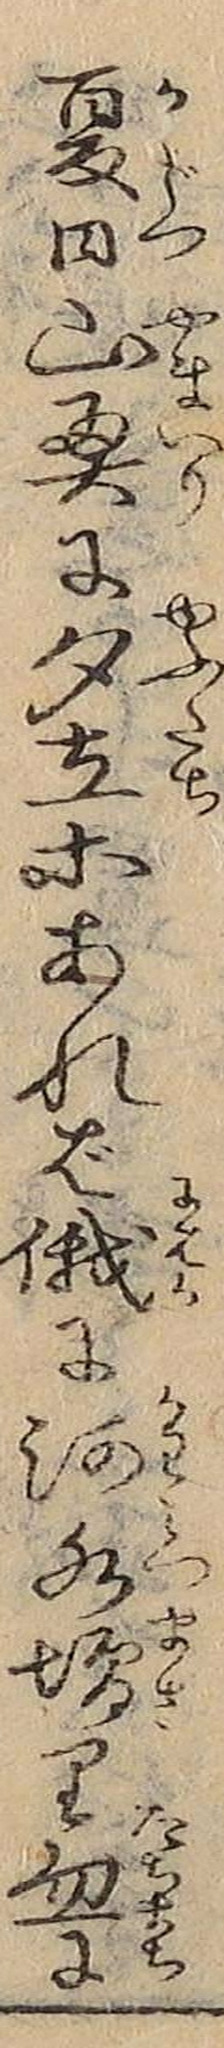夏日山奥に夕立等あれば俄に河水増り忽に
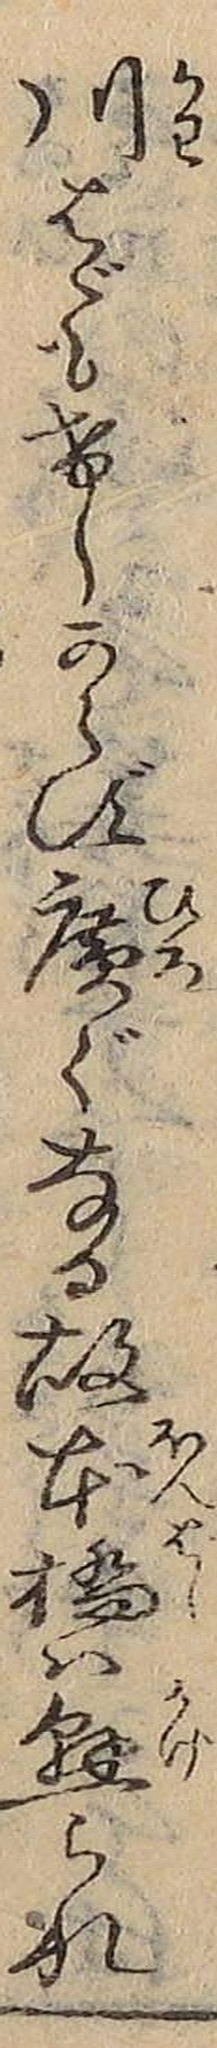川はゞもけしからず広ぐなる故本橋は懸られ
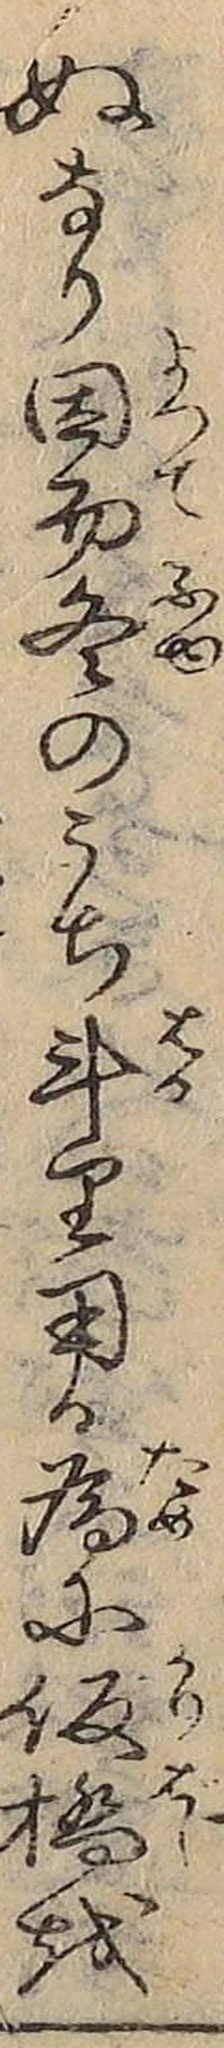ぬなり因而冬のうち計り用る為に仮橋を
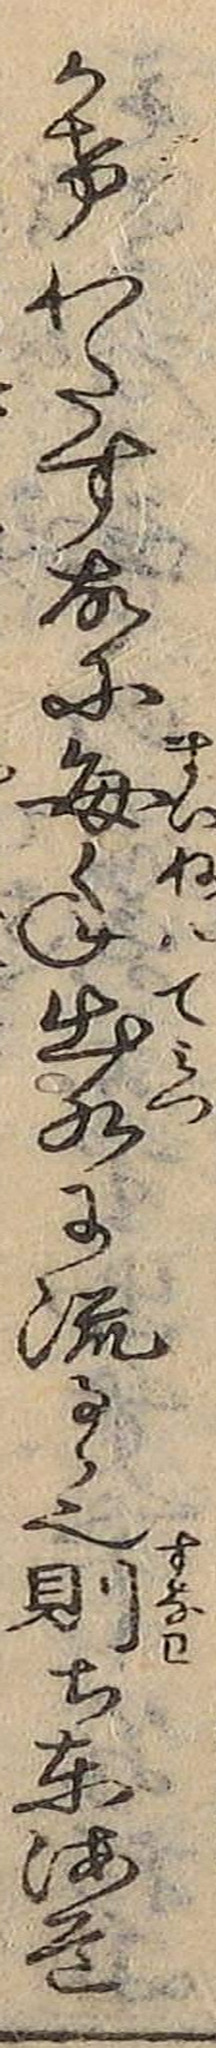かけわたす故に毎年出水に流るゝ也則ち東海道
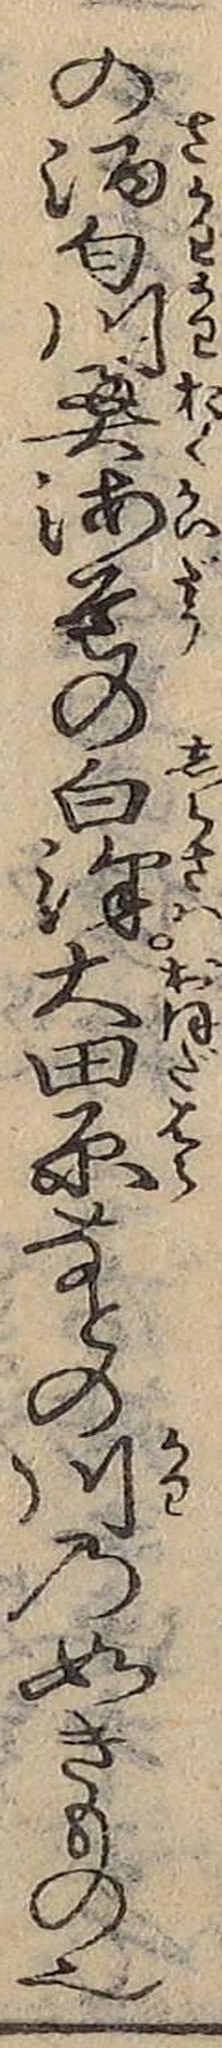の酒匂川奥海道の白沢。大田原なとの川の如きもの也
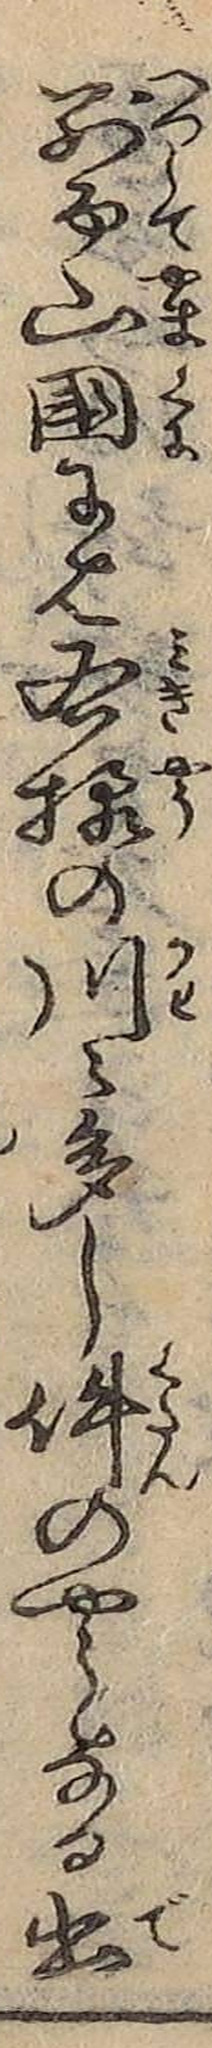別而山国には右様の川々多し件のやうなる出
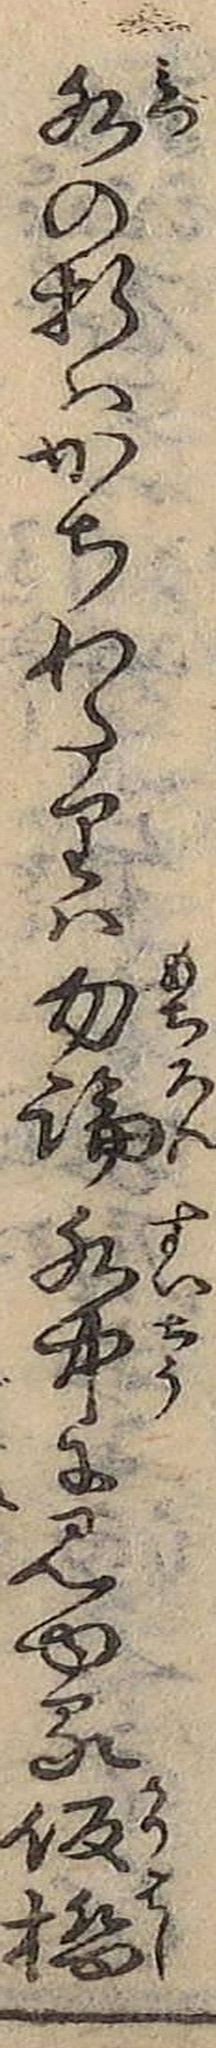水の折はかちわたりは勿論水中に見ゆる仮橋
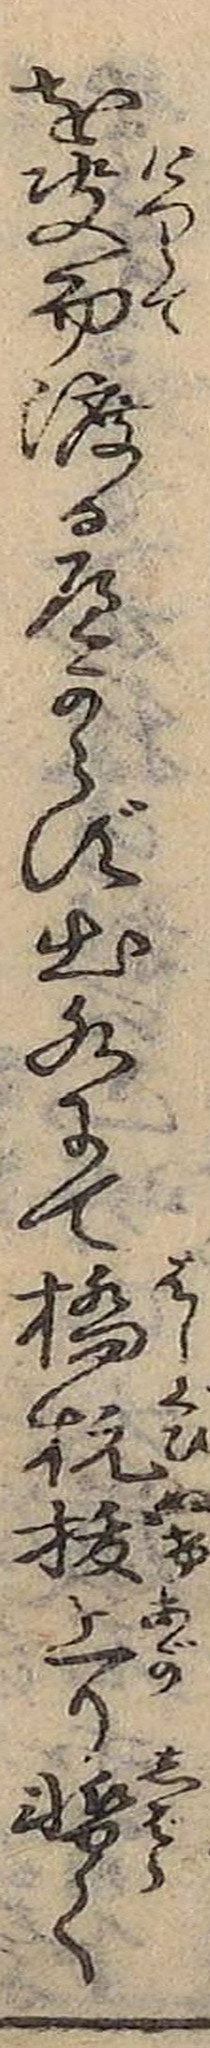を決而渡るへからず出水にて橋杭抜上り暫
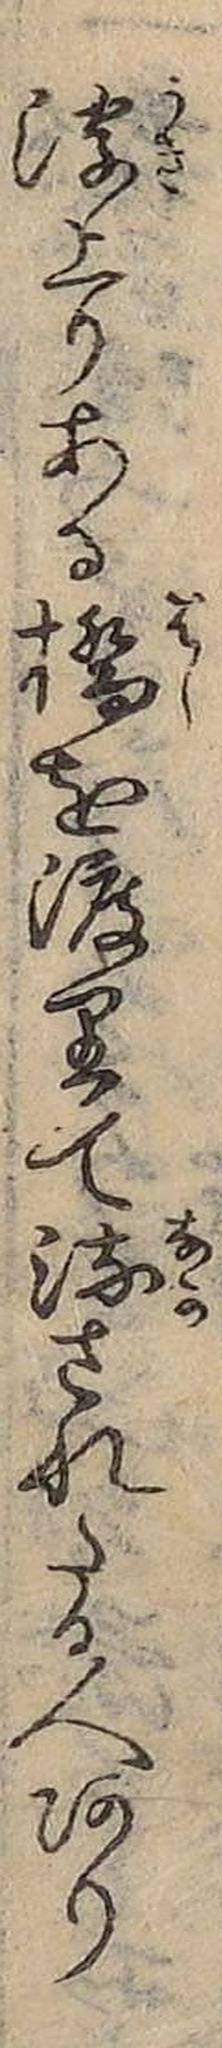浮上りある橋を渡りて流されたる人あり

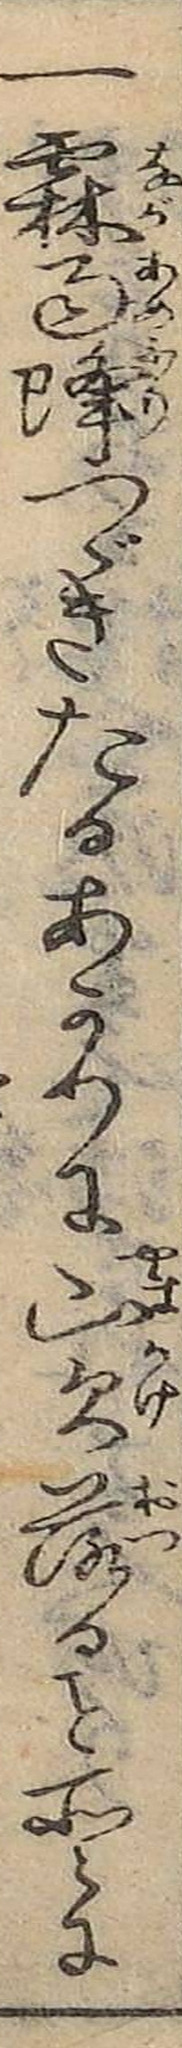一霖雨降つゞきたるあかりに山欠落ること所々に
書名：旅行用心集
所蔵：神戸大学附属図書館 国文学研究資料館
